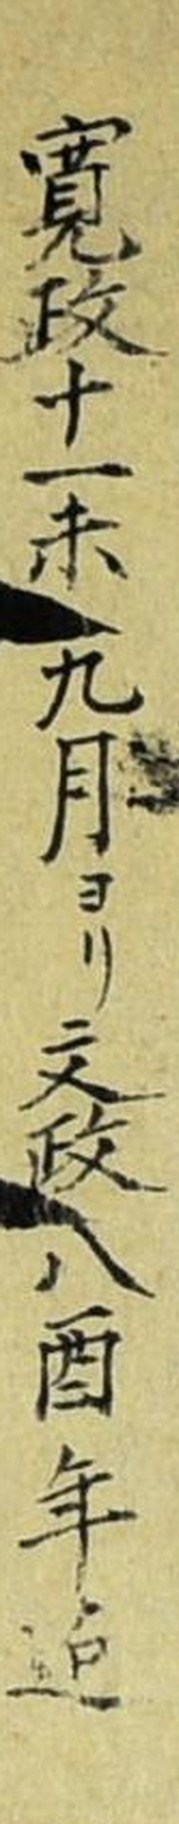寛政十一未九月ヨリ文政八酉年迠

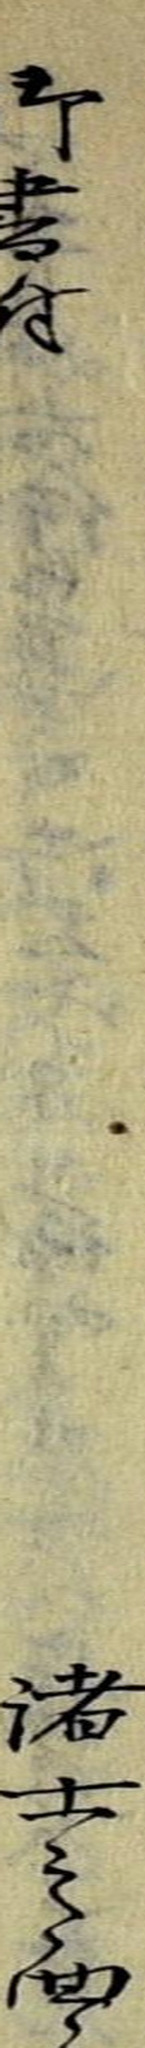御書付諸士之面々
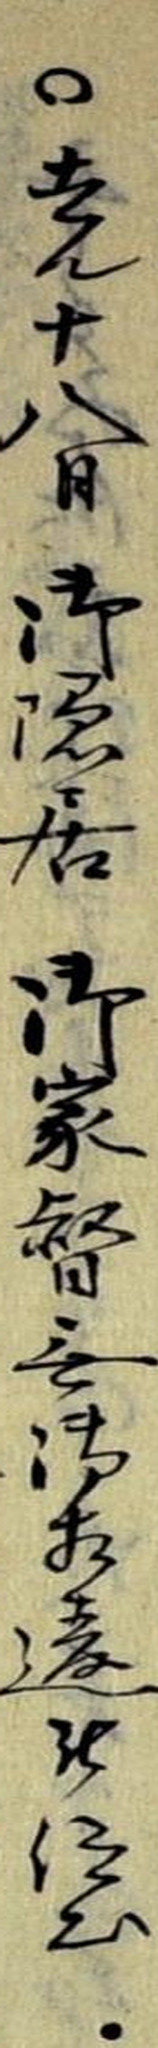○去ル十八日御隠居御家督無御相違被仰出
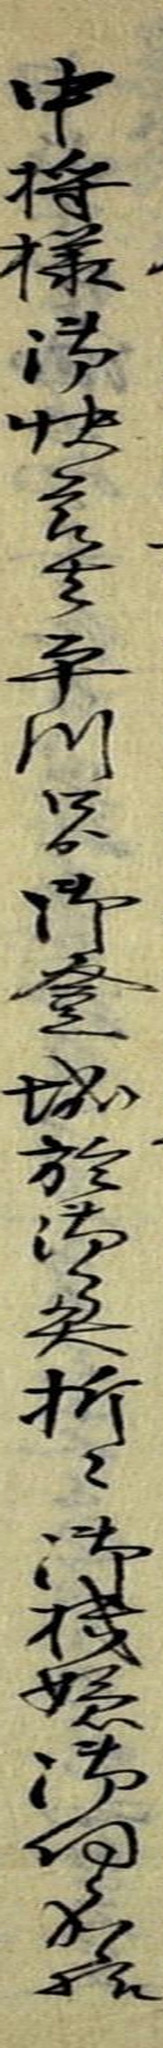中将様御快節は平川口ゟ御登城於御奥折々御機嫌御伺被成候様
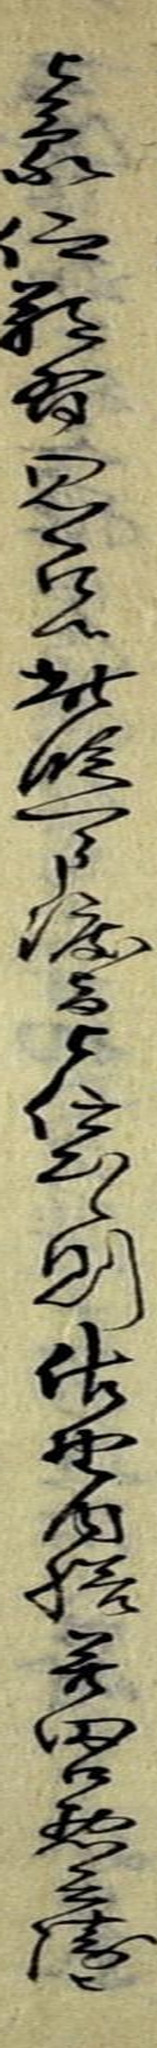被蒙仰難有思召候此段可申渡旨被仰出候則佐野内膳并田口惣兵衛被
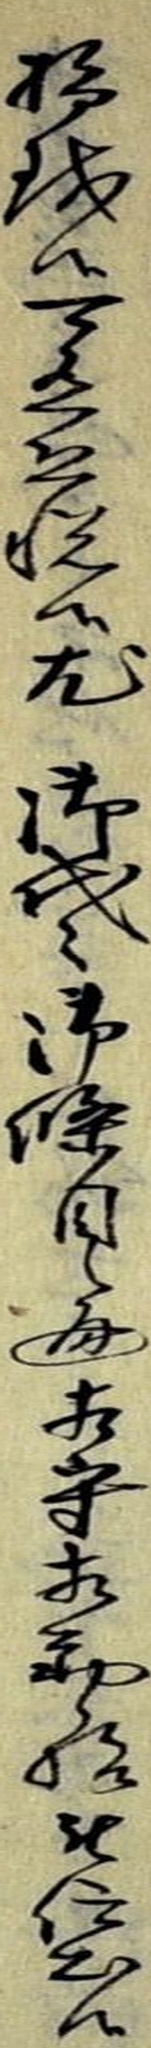指越候可有恐悦候尤御代々御条目之通相守相勤候様被仰出候
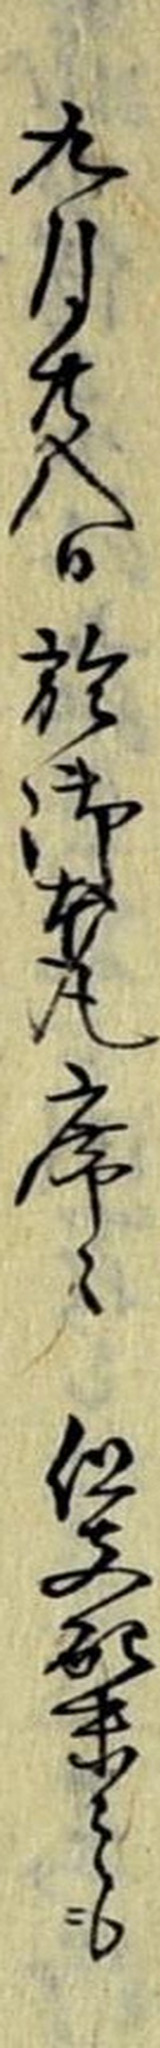九月廿八日於御本丸席々但支配末々へも

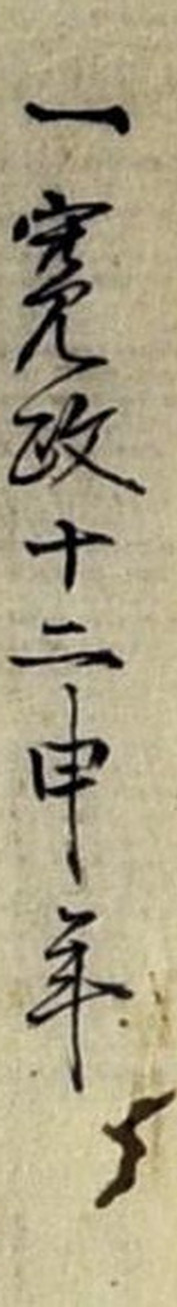一寛政十二申年
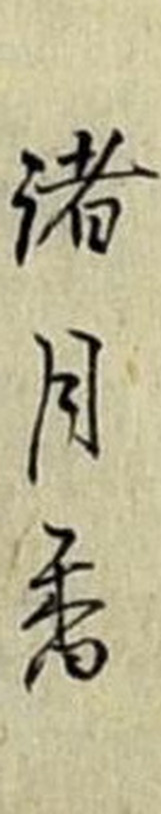諸月番
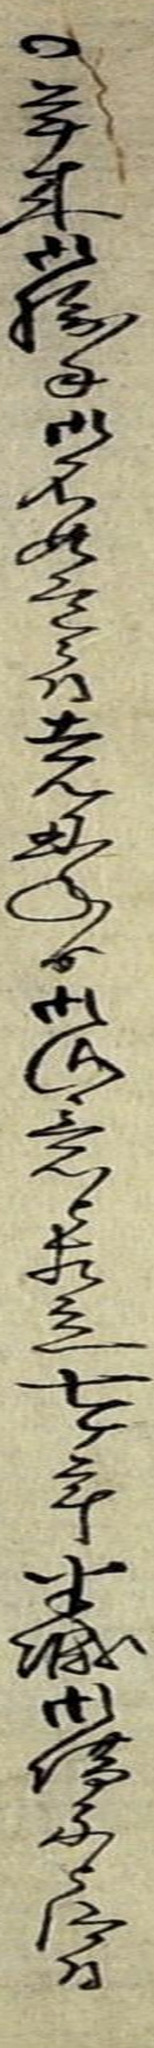○年來御勝手御不如意に付去ル丑年ゟ御趣意被相立七ヶ年半減御借米被仰付
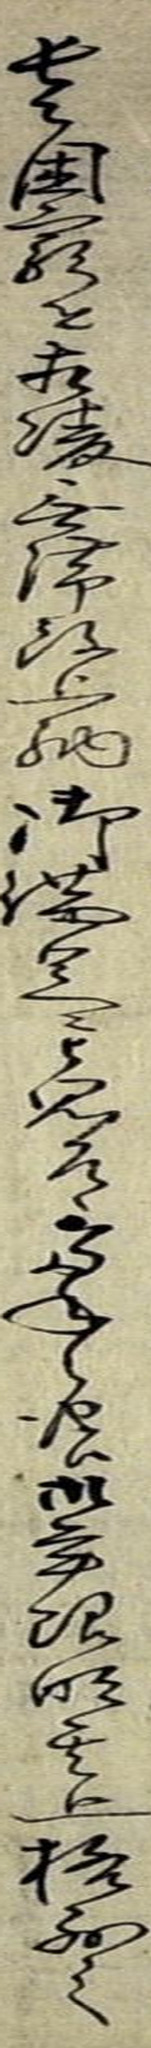長々困窮を相凌無滞致上納御満足に被思召候当年之儀は御年限明其上格外之
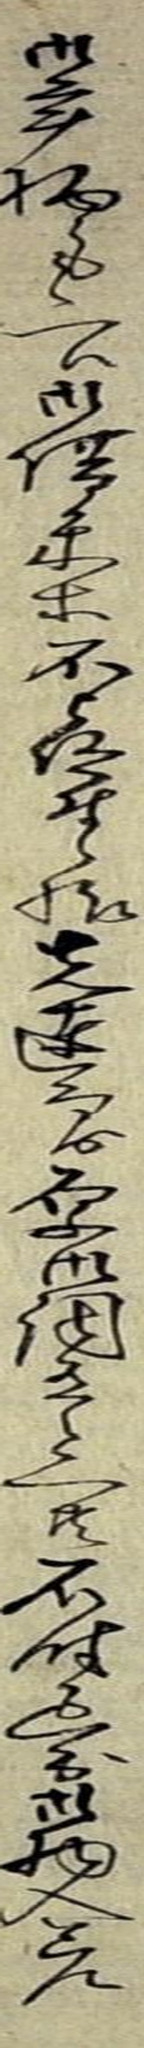御年柄にも候へは御借米等不被仰付候様先達而ゟ厚御調有之候へ共不時過分御物入差
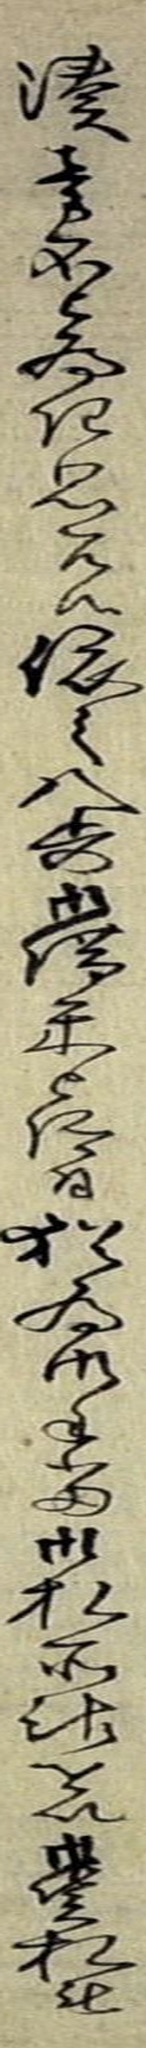湊旁不被為任思召候依之八歩御借米被仰付候付猶為御手当御札所銀を以御貸札被
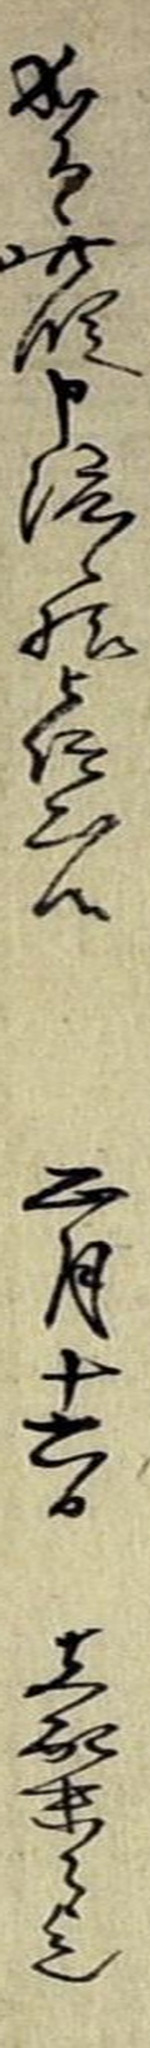成下候此段申渡候様被仰出候正月十六日支配末々迄
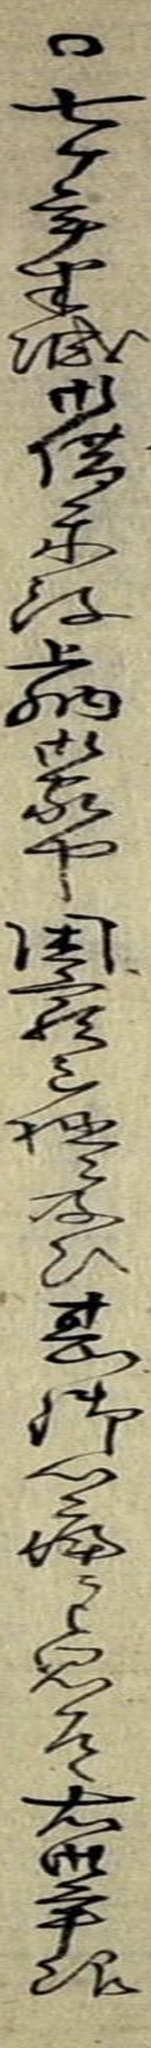○七ヶ年半減御借米致上納御家中困窮至極ニ及ひ甚御心痛に被思召候右御年限
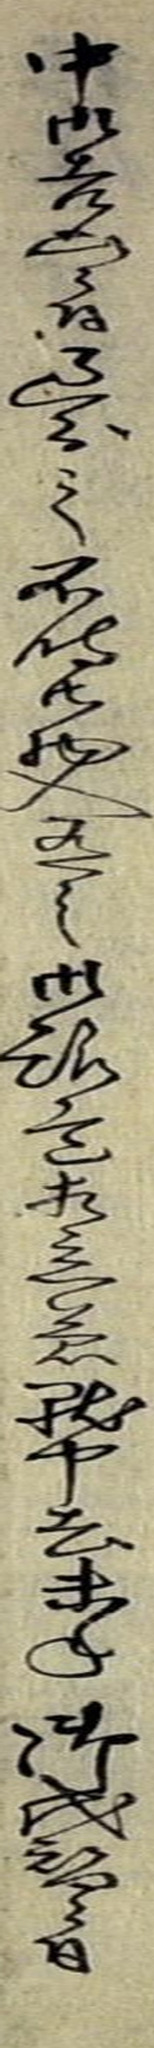中吉凶に付過分之不時御物入有之御趣意相立兼就中去未年御代替に付
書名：命令之部 四
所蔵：福井県文書館 Fukui Prefectural Archives
